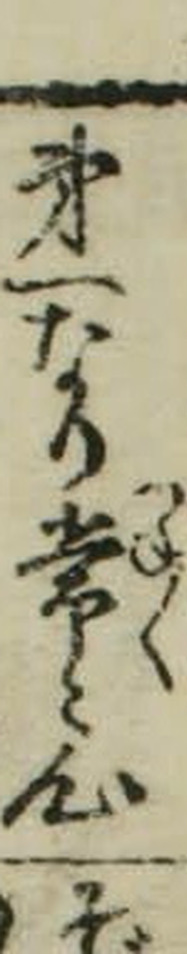第一なり常々心
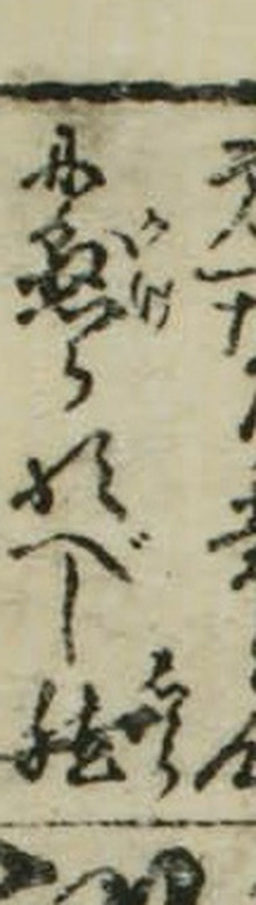に懸らるべし然
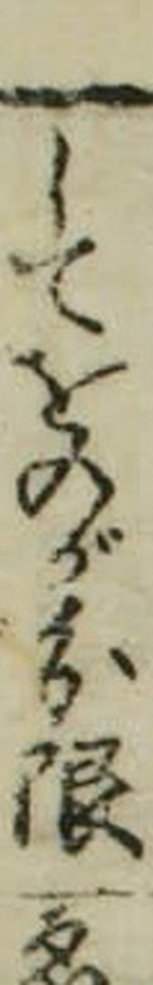してをのが分限
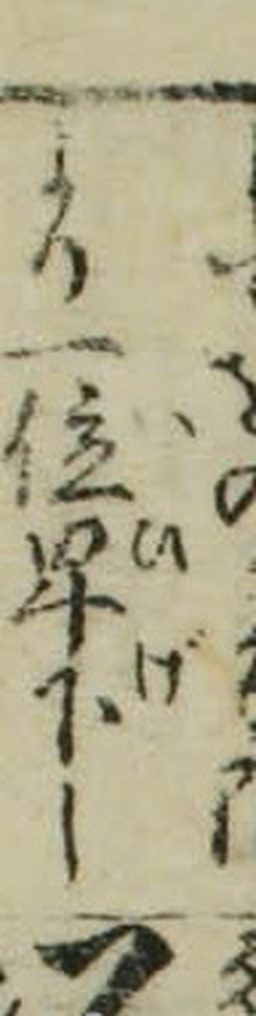より一位卑下し
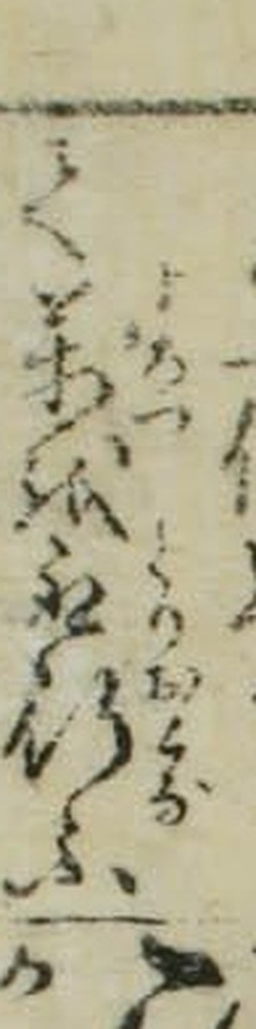て萬を取行ふ
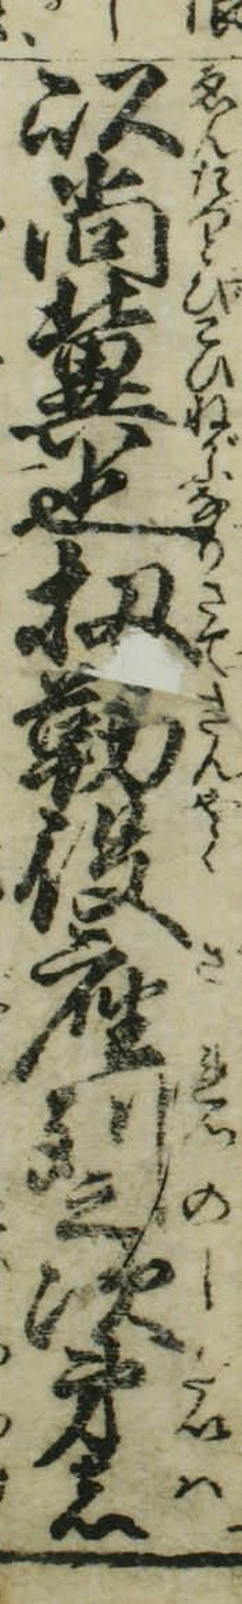以尚冀也扨勤役座列の次第は
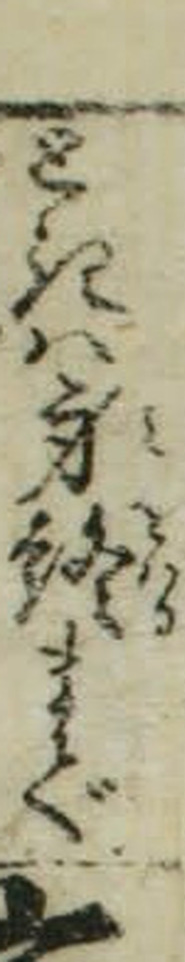ときは身終まで
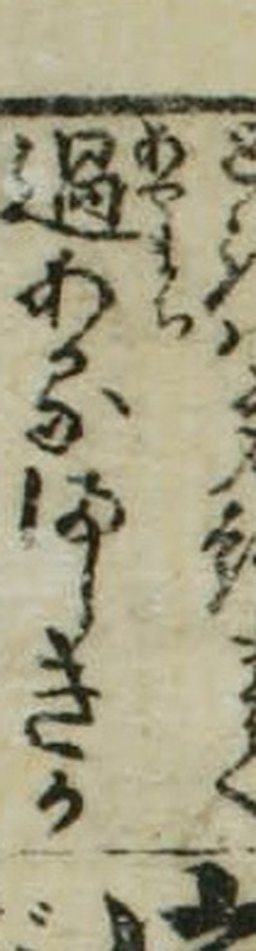過あるましきか
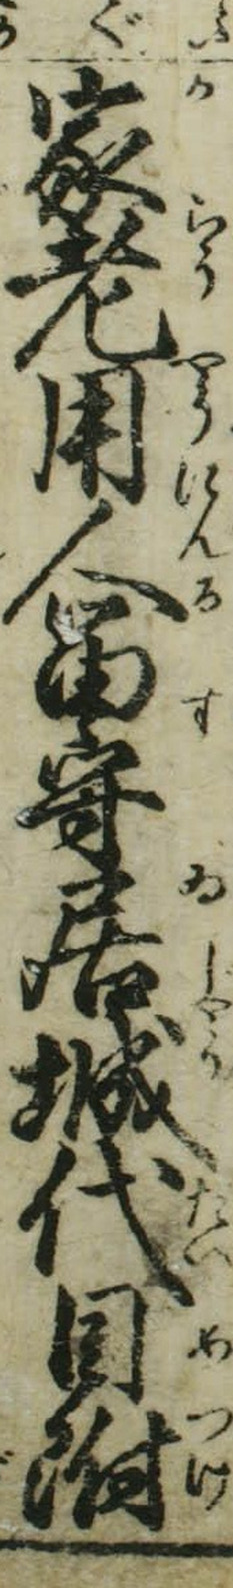家老用人留守居城代目付
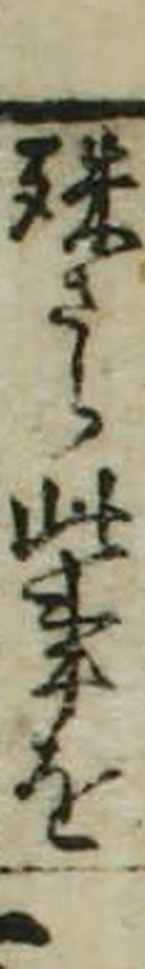殊さら此事を
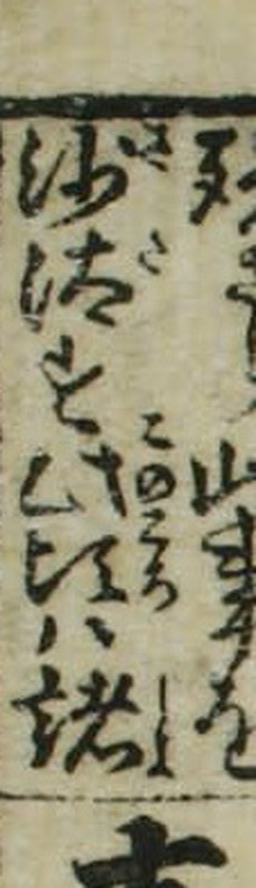沙汰す此頃は諸
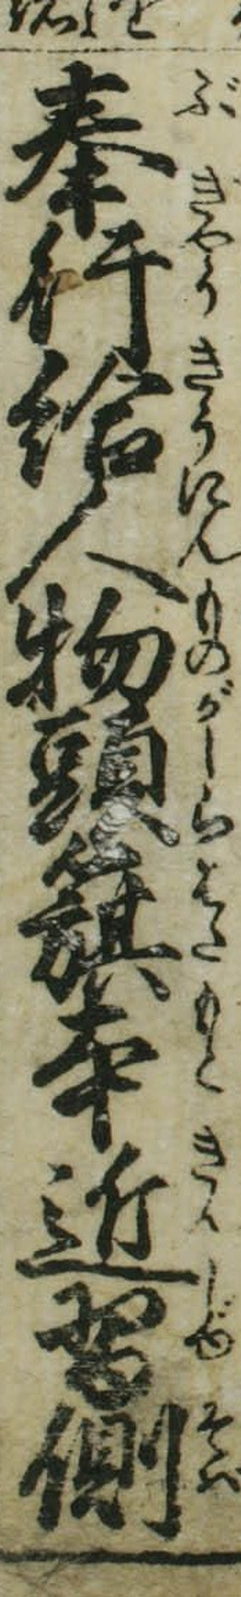奉行給人物頭旗本近習側

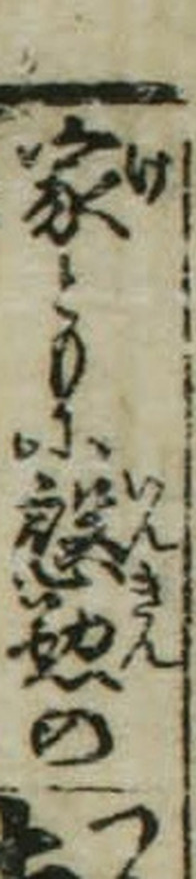家ともに慇懃の
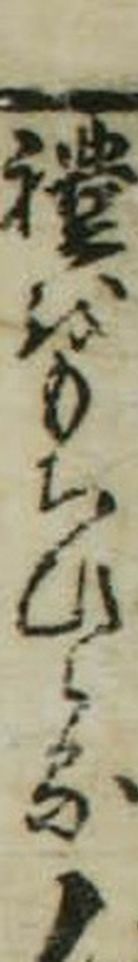礼をもちひる
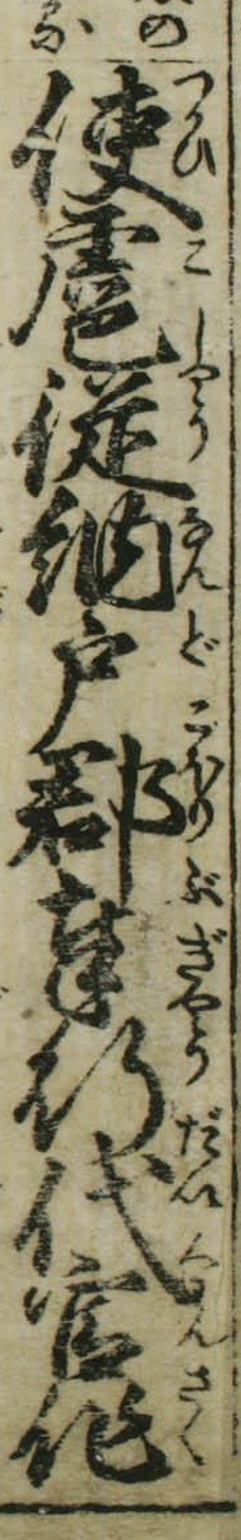使扈従納戸郡奉行代官作
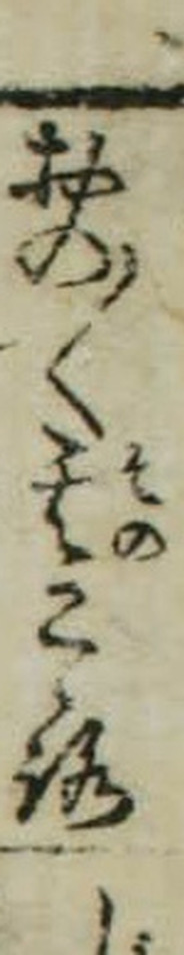おの〳〵其こゝろ
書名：増補職人往来
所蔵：東京学芸大学教育コンテンツアーカイブ
